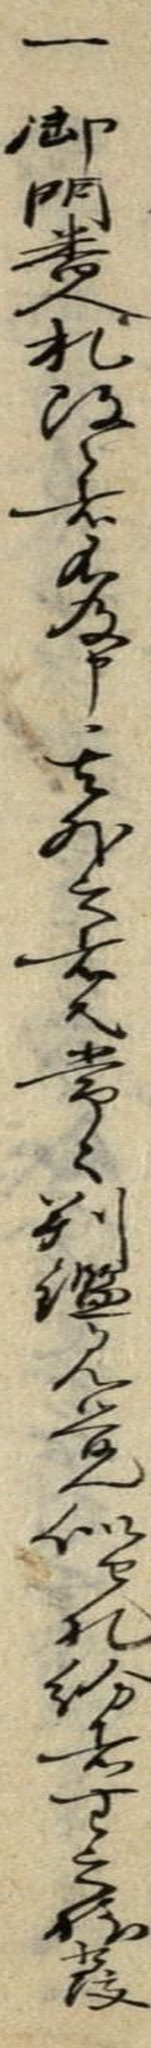一御門番人札改之者不及申其外之者共常々判鑑見覚似せ札紛者無之様相改
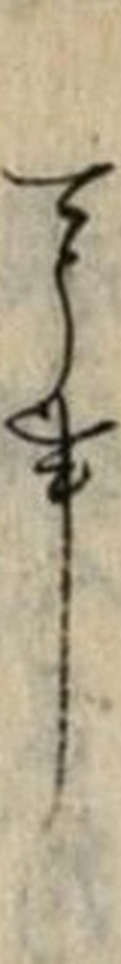可申事
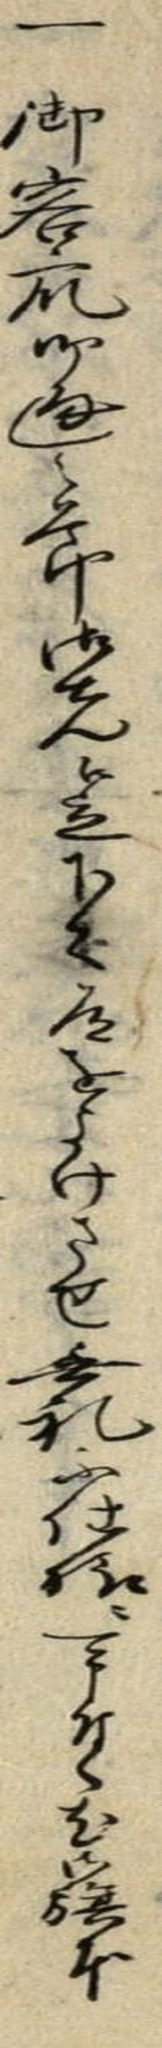一御客衆御通之節御先江立下々道をよけさせ無礼不仕様に可申付候尤御旗本
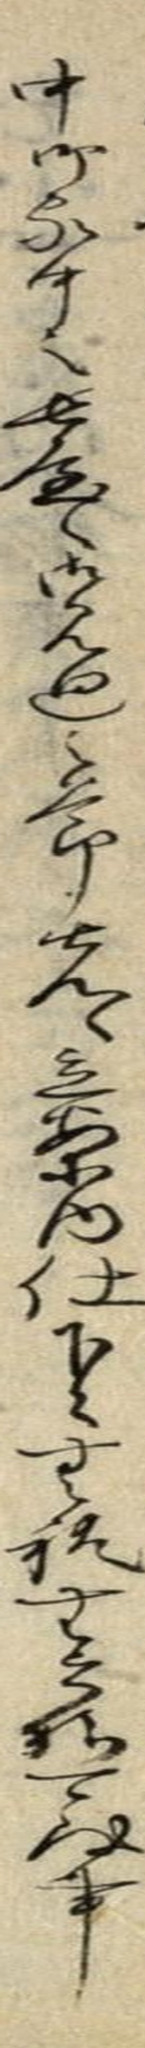中御家中之長屋へ御見廻之節先へ立案内仕下々無礼無之様可致事
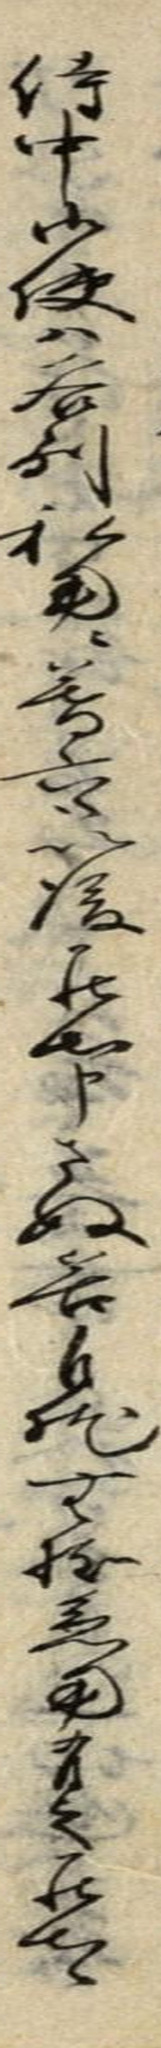一侍中御使は各別私用に暮六ツ以後罷出申さぬ筈自然無據急用有之罷出候
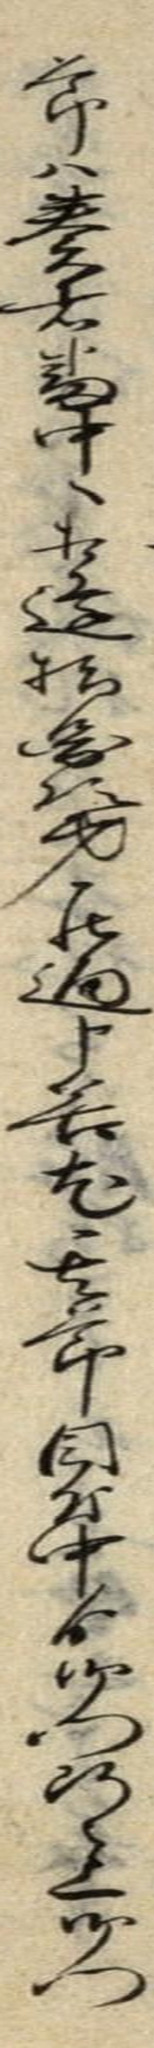節は奏者番中へ相達指図次第罷通申筈尤其節目付中ゟ御門断之上御門
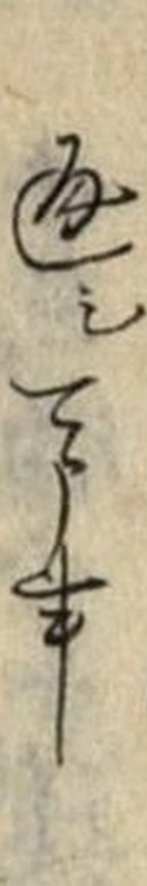通し可申事
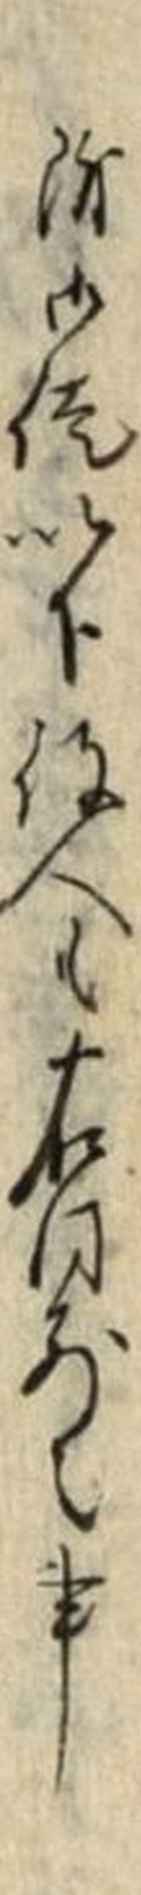附御徒以下役人も右同前之事
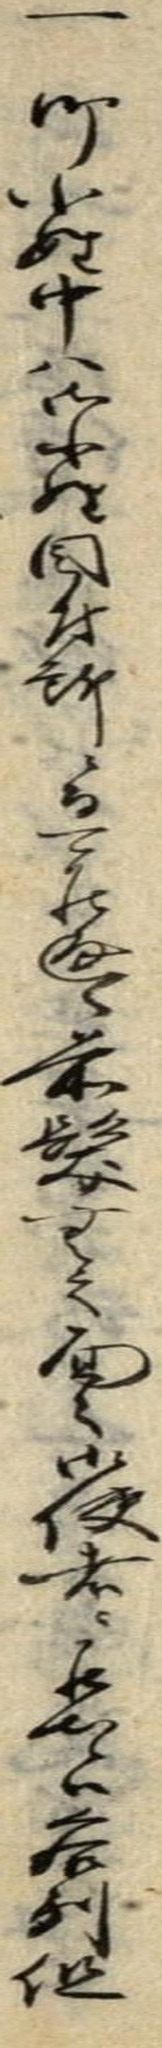一御小姓中は御小姓目付断にて可罷通候前髪無之面々御使者に罷出候は各別但
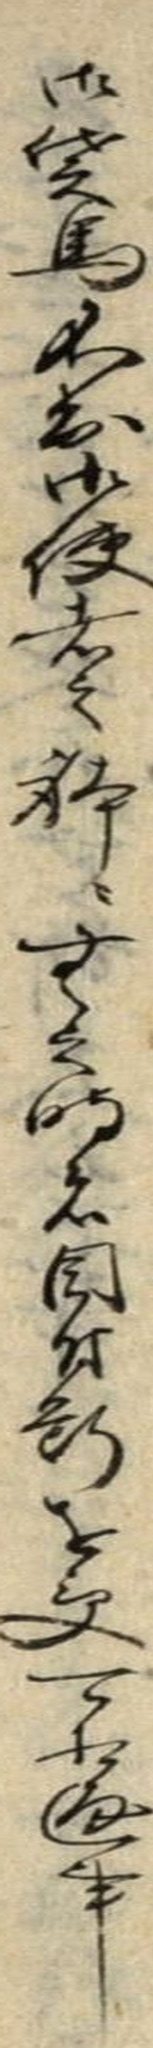御貸馬不出御使者之体に無之時は目付断を受可相通事

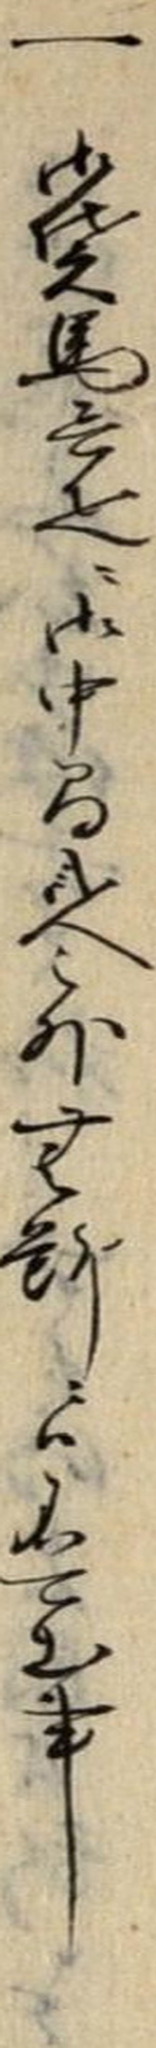一御貸馬壱疋に御中間弐人之外無断には不可出事
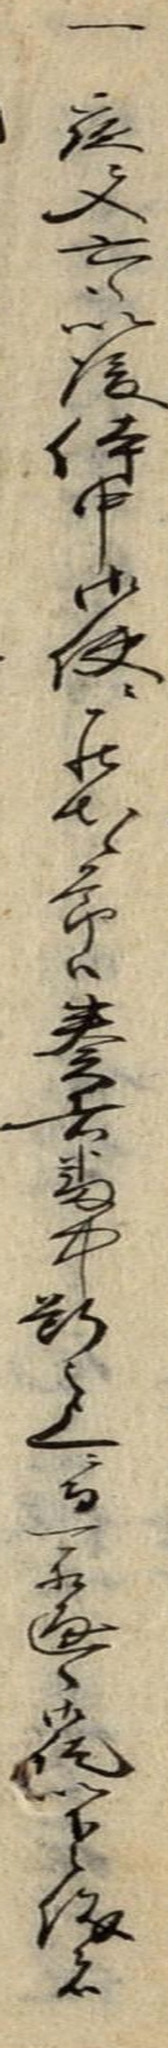一夜に入六ツ以後侍中御使に罷出候節は奏者番中断之上にて可罷通候御徒以下之儀は
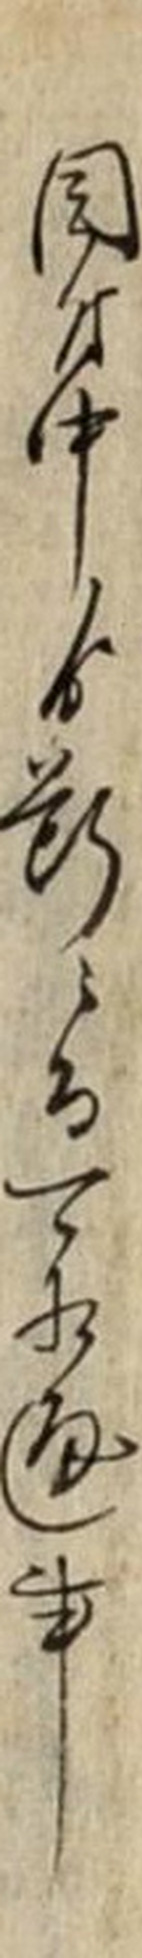目付中ゟ断にて可相通事
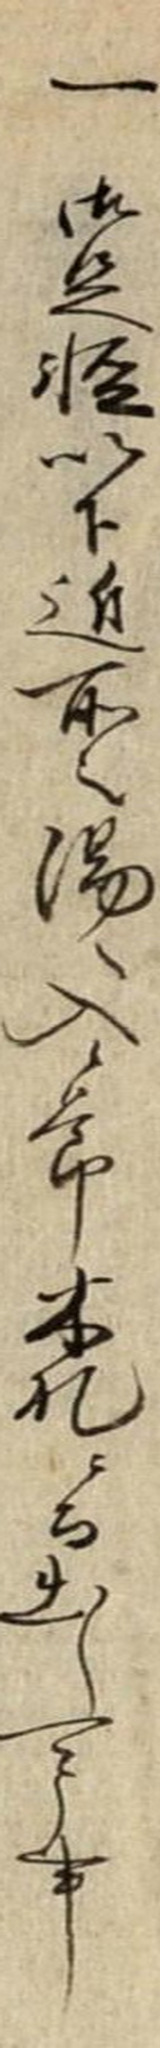一御足軽以下近所之湯へ入候節木札にて出し可申事
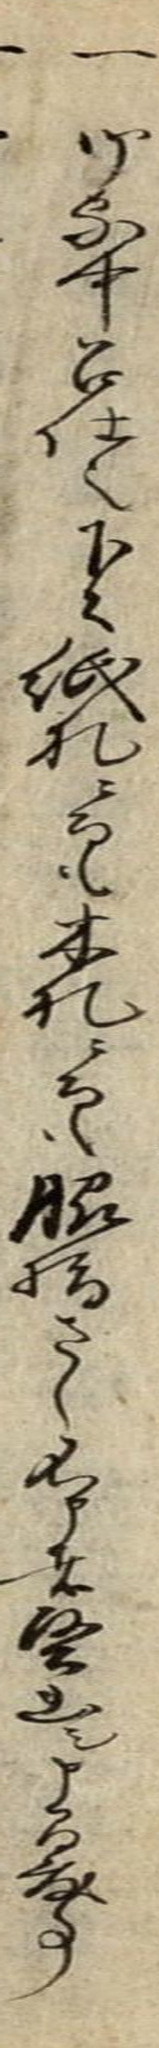一御家中召仕之下々紙札にても木札にても脇指さし不申者堅出し申間敷事
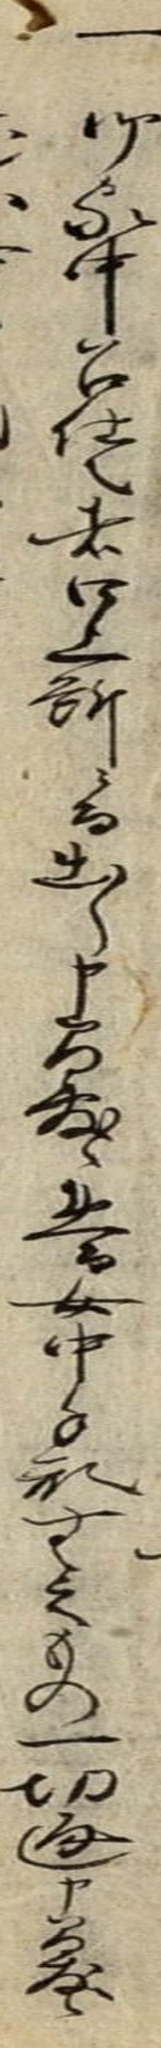一御家中召仕之者口上断にて出し申間敷候惣て女中手形無之もの一切通申間敷候
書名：三都并道中之部
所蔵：福井県文書館 Fukui Prefectural Archives
